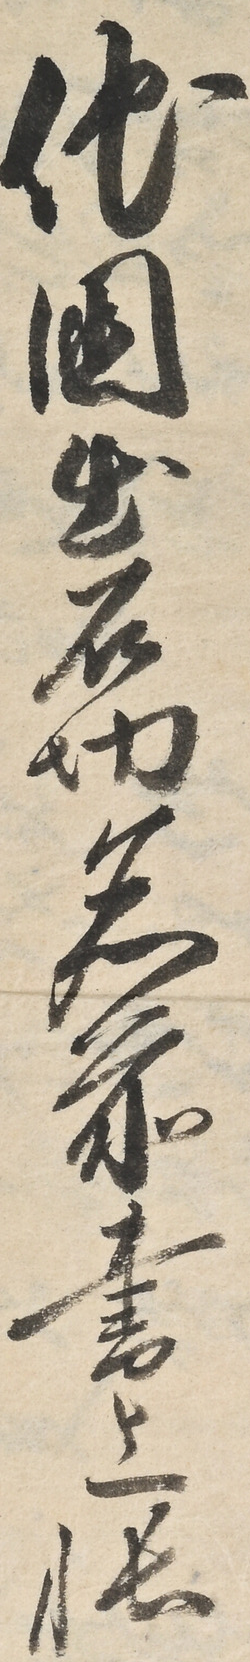他国出石切名前書上帳

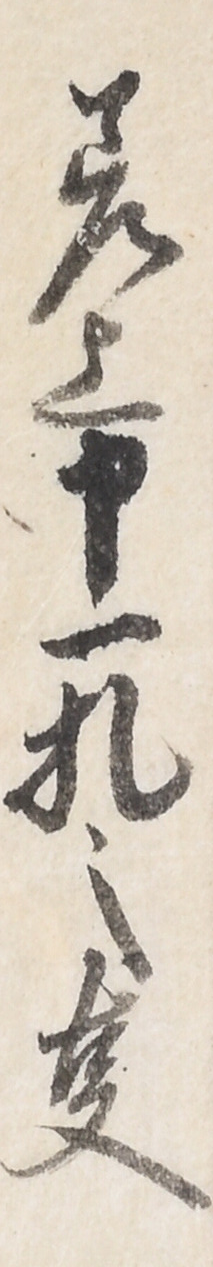差上申一札之事
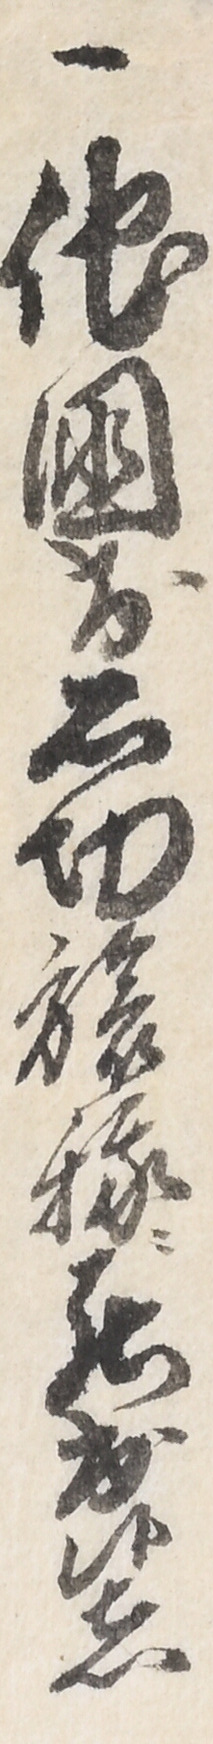一他国出石切旅稼ニ罷出候者
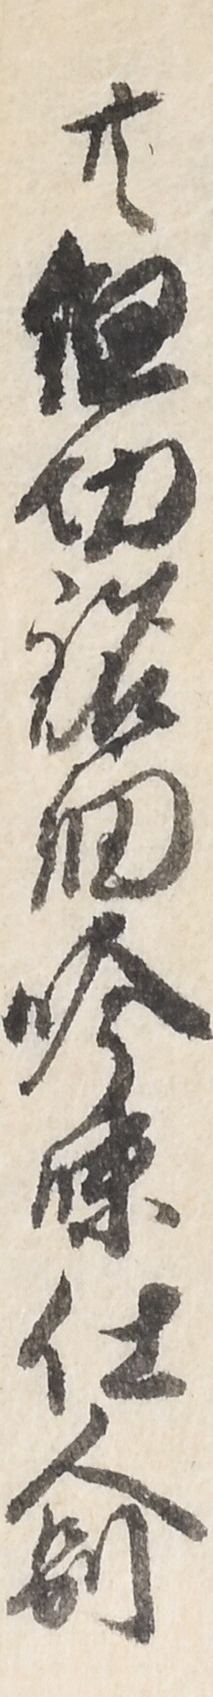共組切銘細吟味仕人別
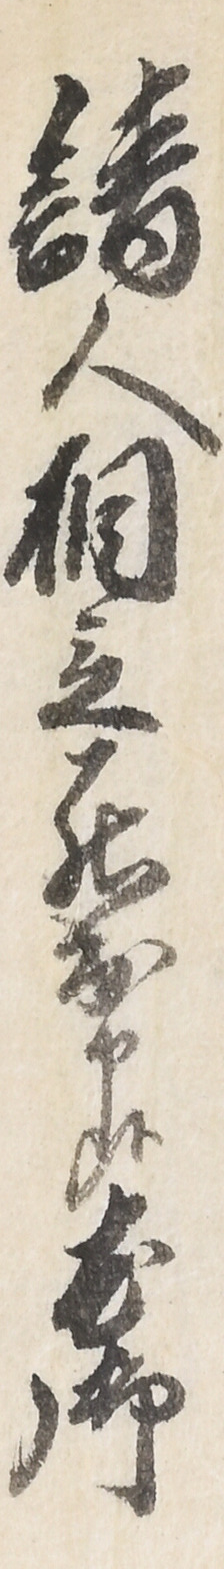請人相立罷出申候尤御
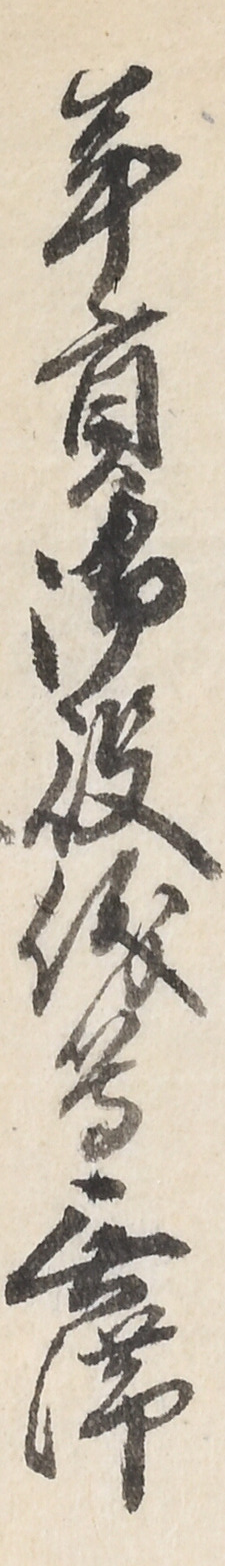年貢御役儀等無滞
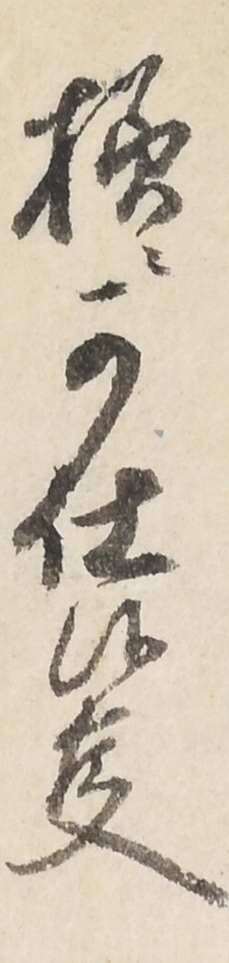様ニ可仕候事
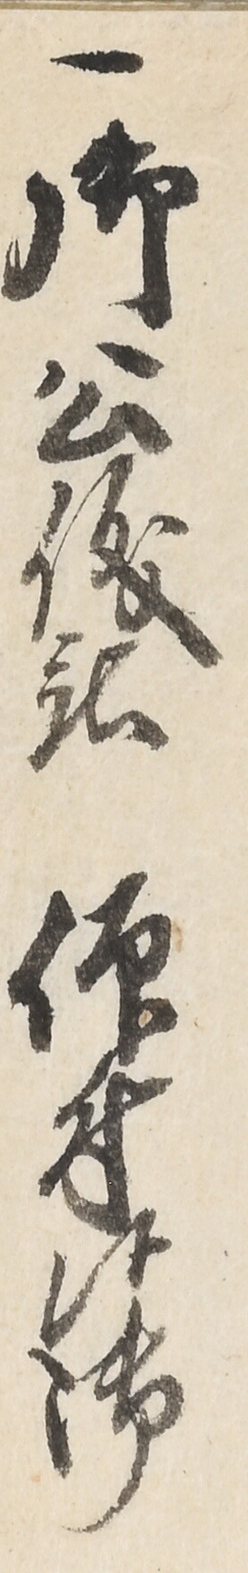一御公儀被仰付候御
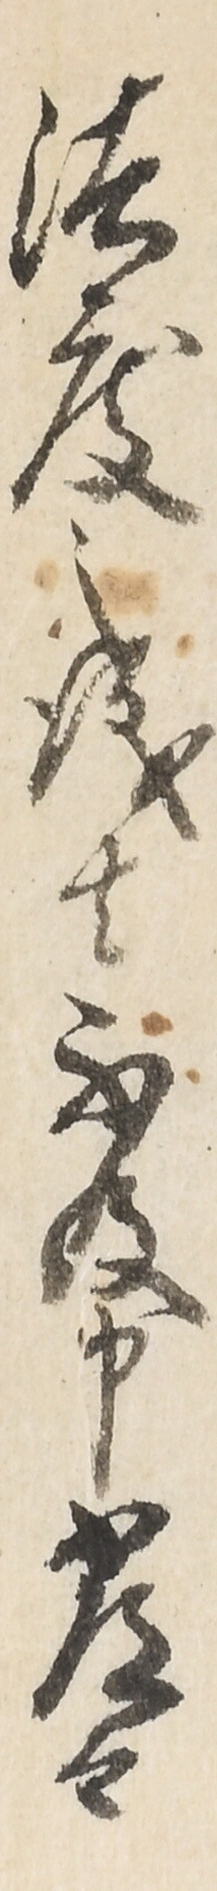法度之儀者不及申常々
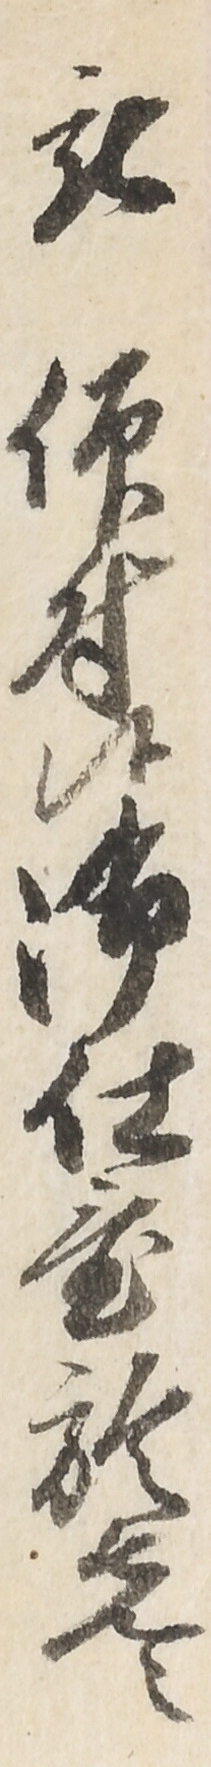被仰付候御仕置於先々
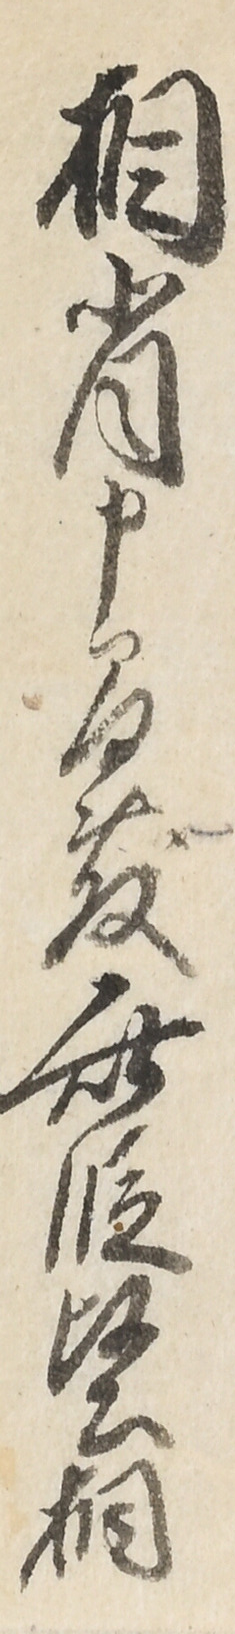相背申間敷此段堅相
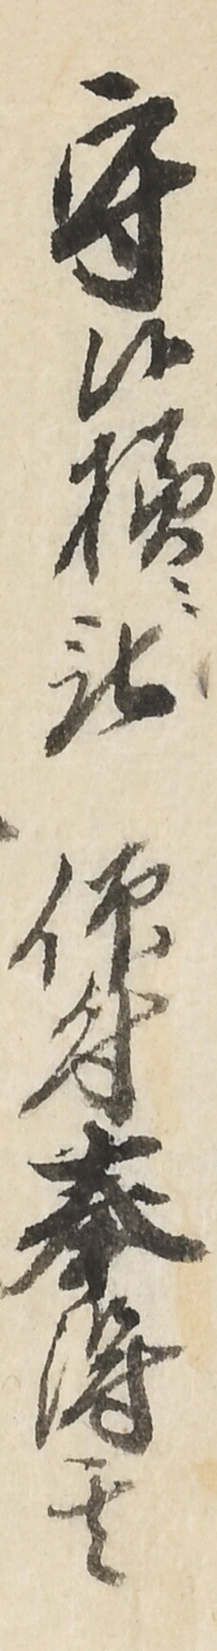守候様ニ被仰付奉得其
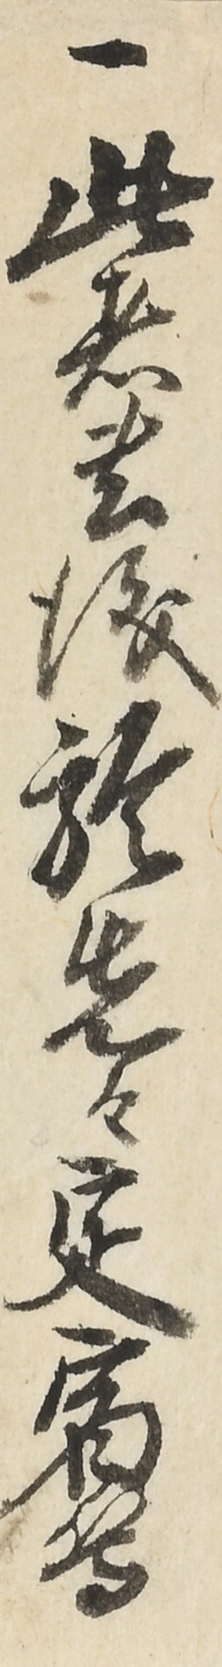一此者共儀於先々定宿等
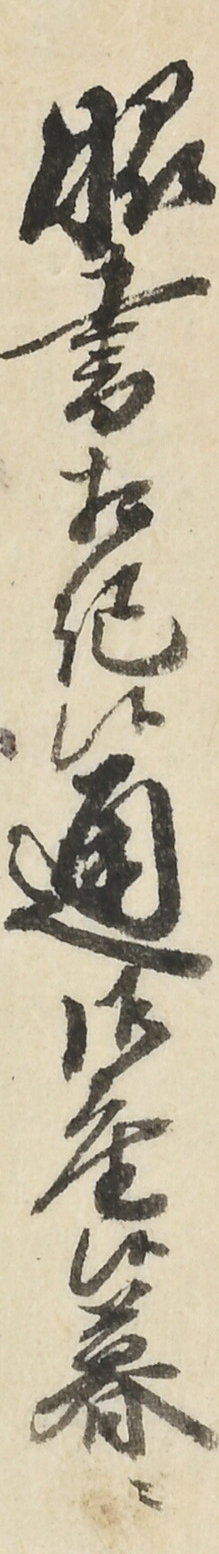脇書相記候通御座候暮ニ
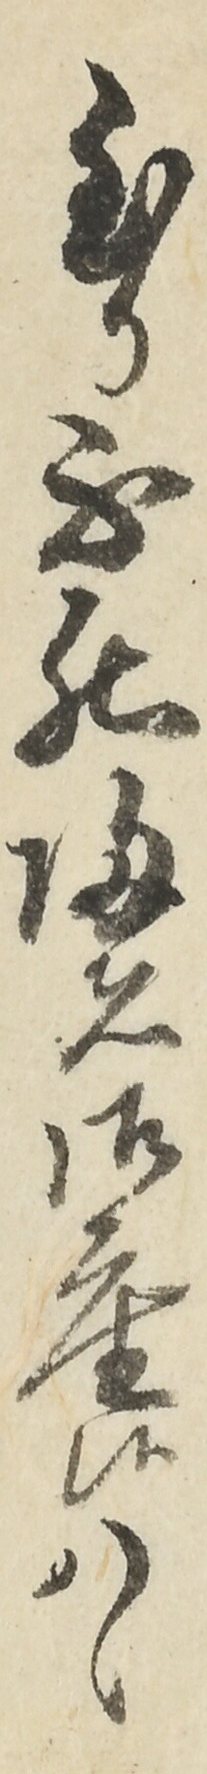至り不罷帰者御座候ハヽ
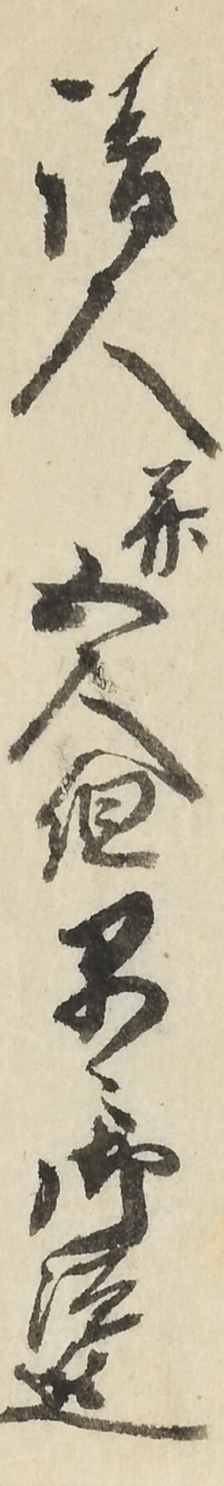請人幷五人組早々御注進
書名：慶應元乙丑年二月他國出石切名前書上帳
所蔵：伊那市立高遠町図書館・合同会社AMANE
